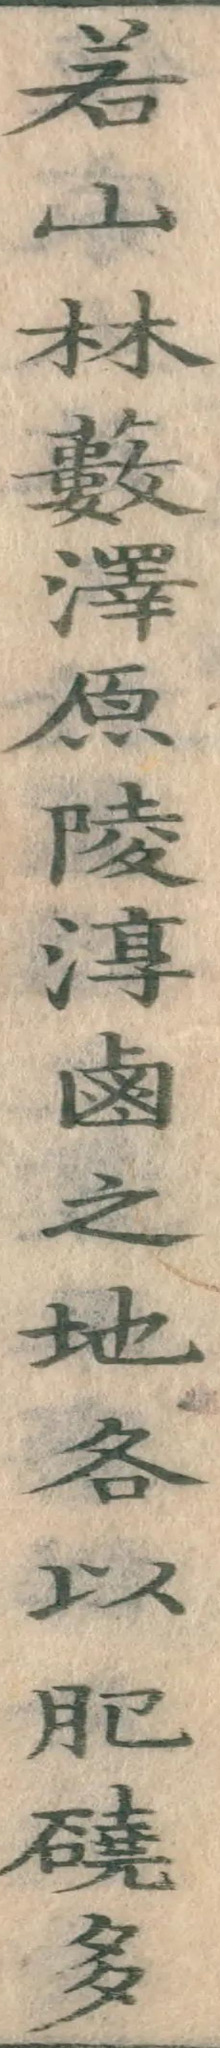若山林薮沢原陵淳鹵之地各以肥磽多
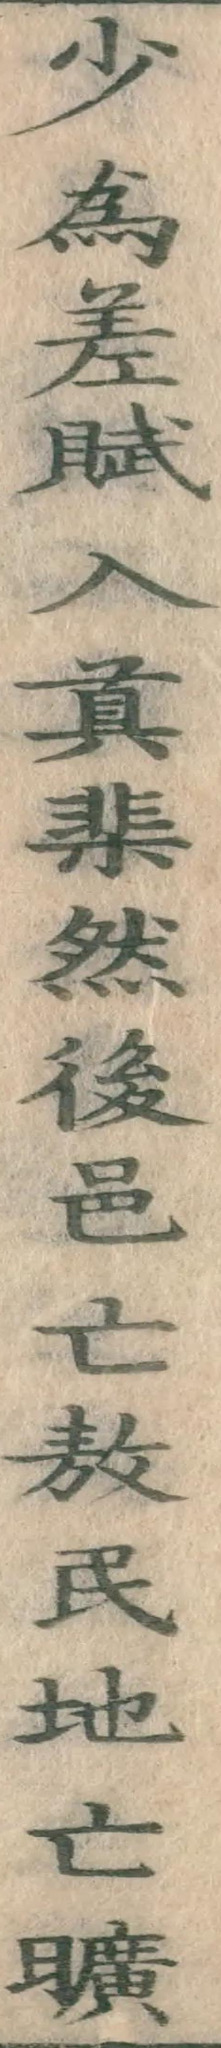少為差賦入貢棐然後邑亡敖民地亡曠
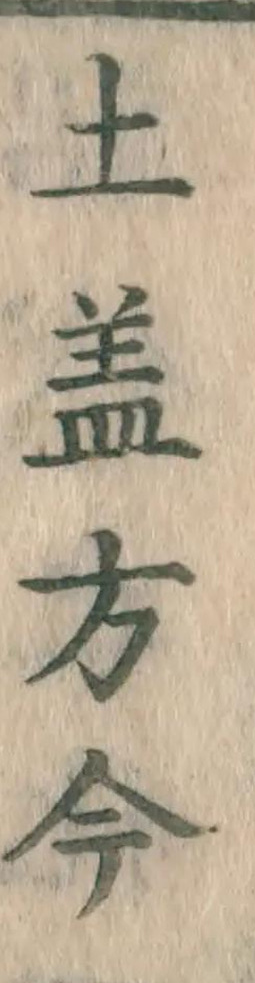土盖方今

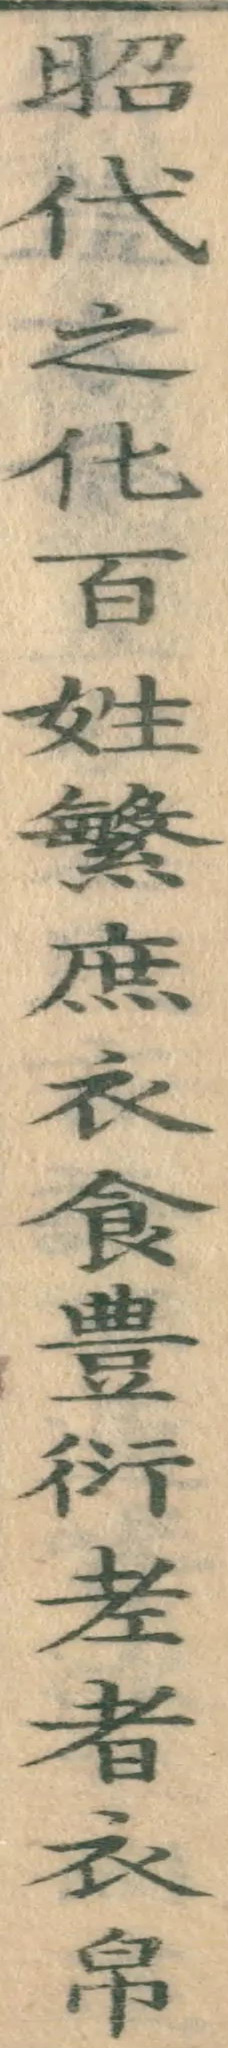昭代之化百姓繁庶衣食豊衍老者衣帛
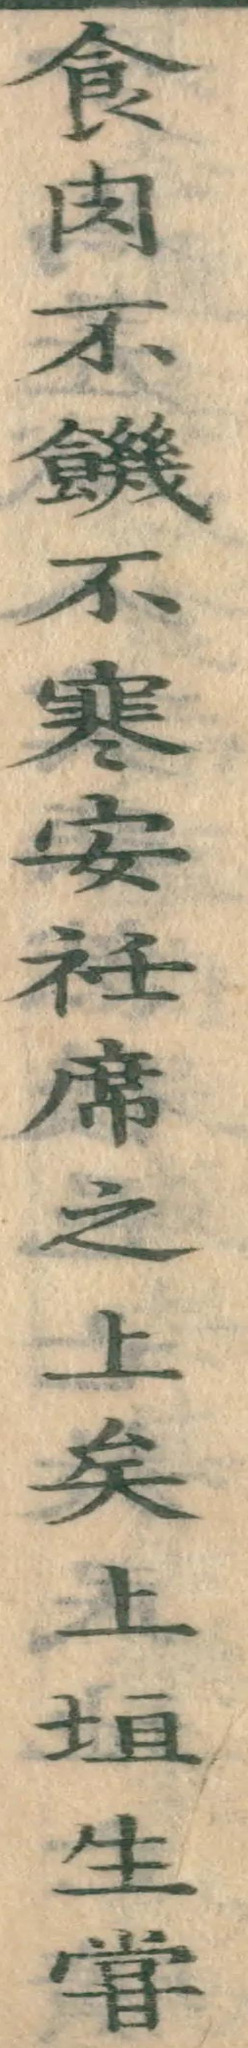食肉不饑不寒安衽席之上矣上垣生甞
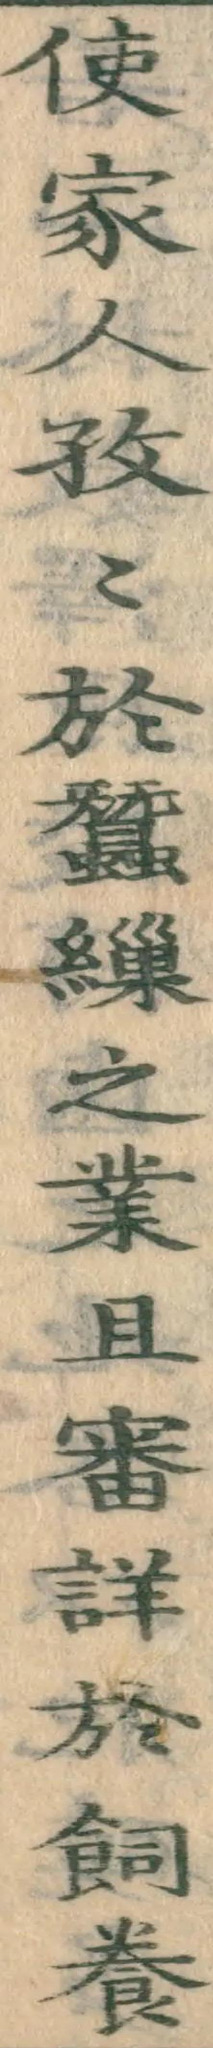使家人孜々於蚕繅之業且審詳於飼養
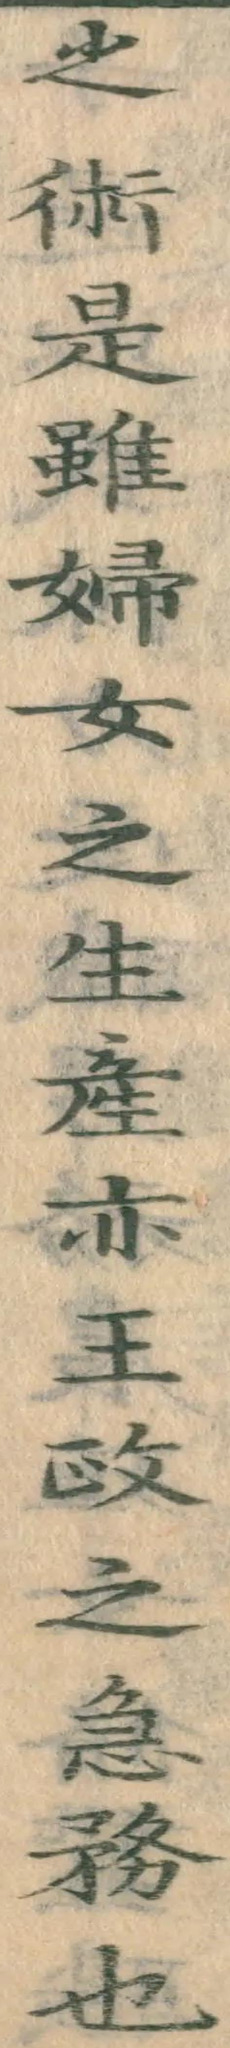之術是雖婦女之生産亦王政之急務也
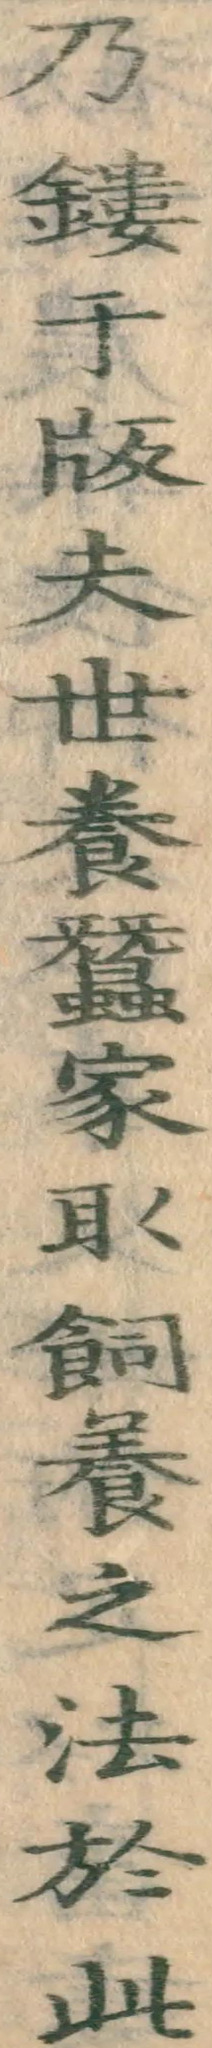乃鏤于版夫世養蚕家取飼養之法於此
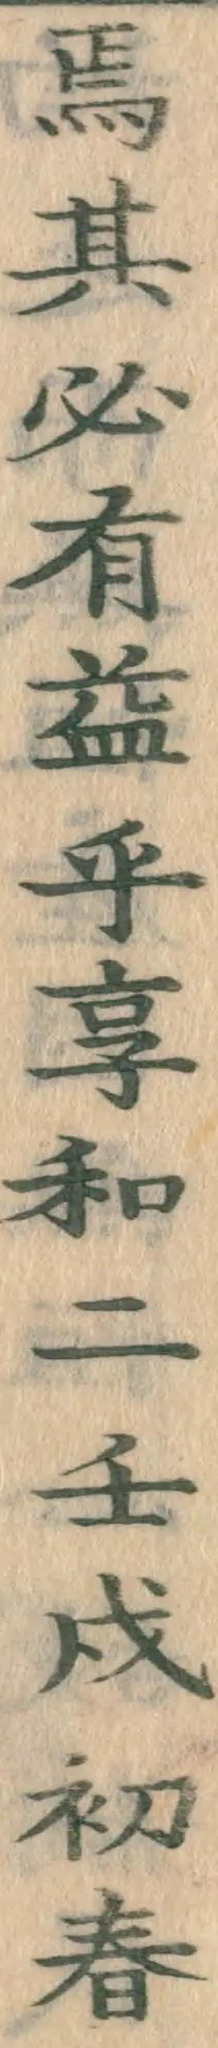焉其必有益乎享和二壬戌初春
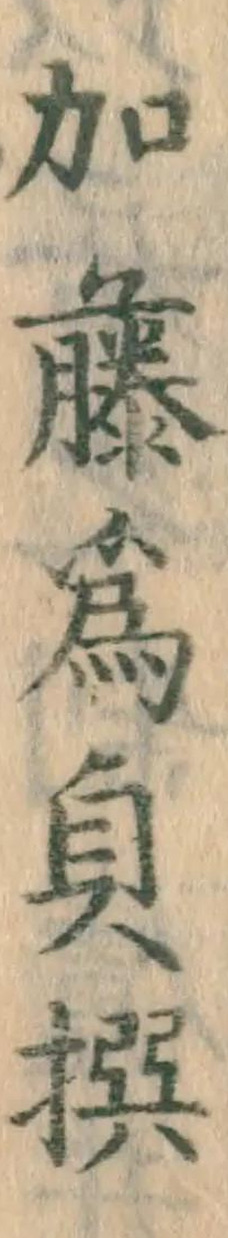加藤爲貞撰
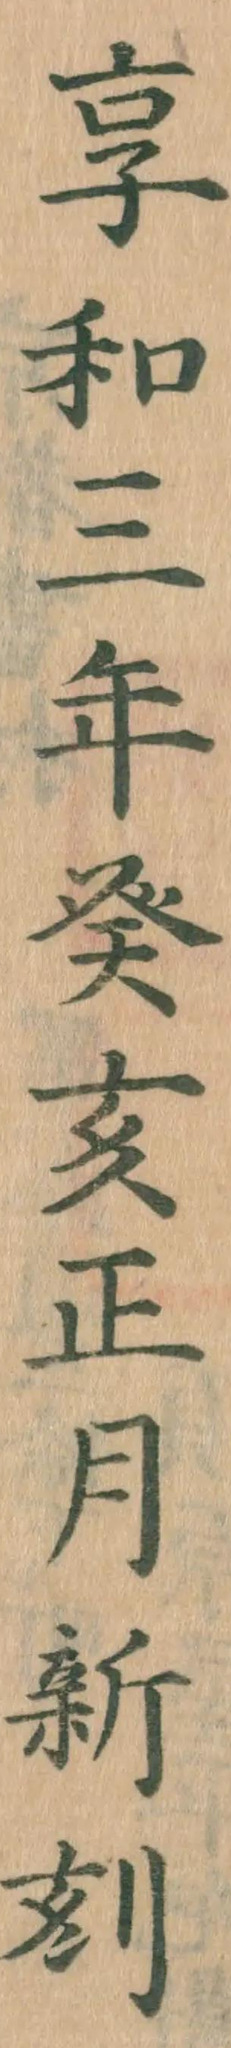享和三年癸亥正月新刻
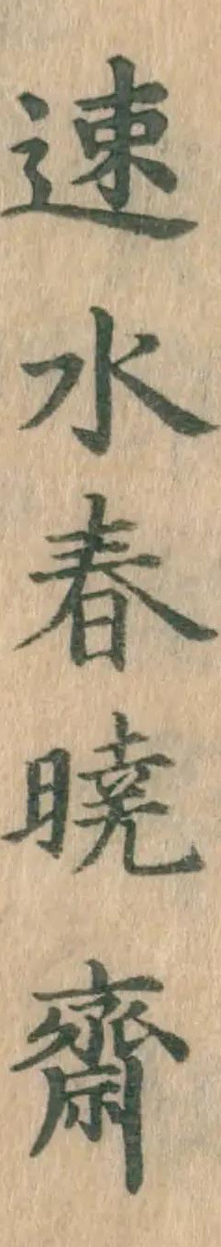速水春暁斎
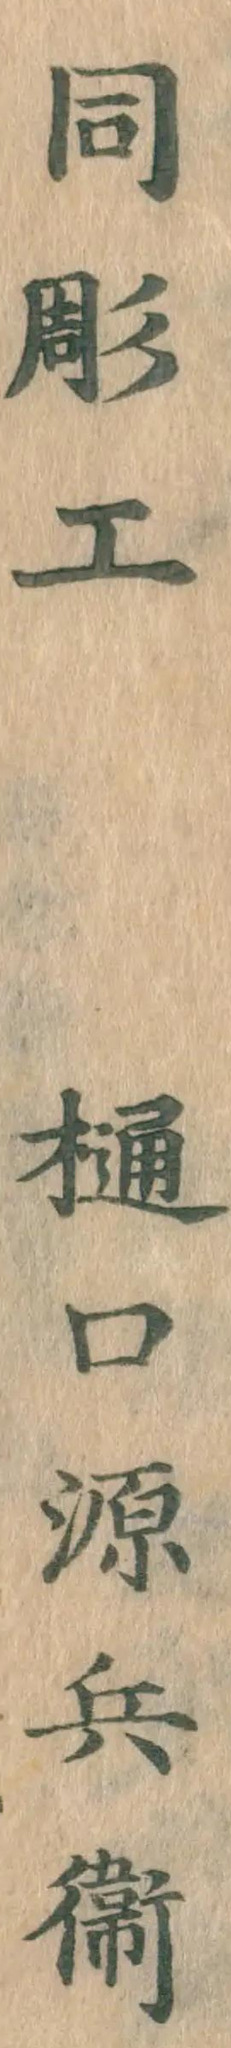同彫工樋口源兵衛
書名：養蚕秘録 3巻. [3]
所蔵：国立国会図書館 National Diet Library, JAPAN
